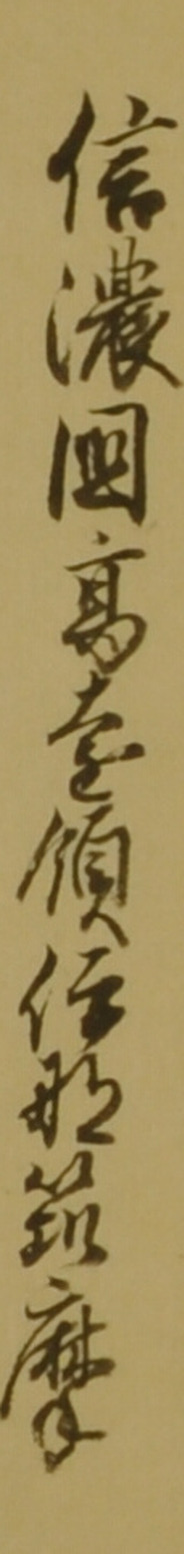信濃国高遠領伊那筑摩
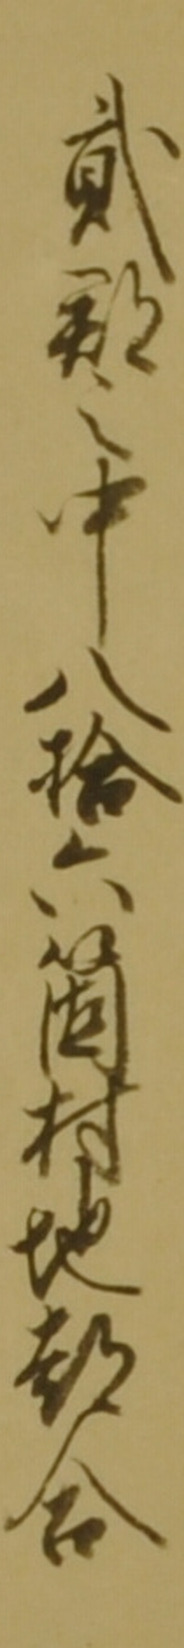弐郡之中八拾六箇村地都合
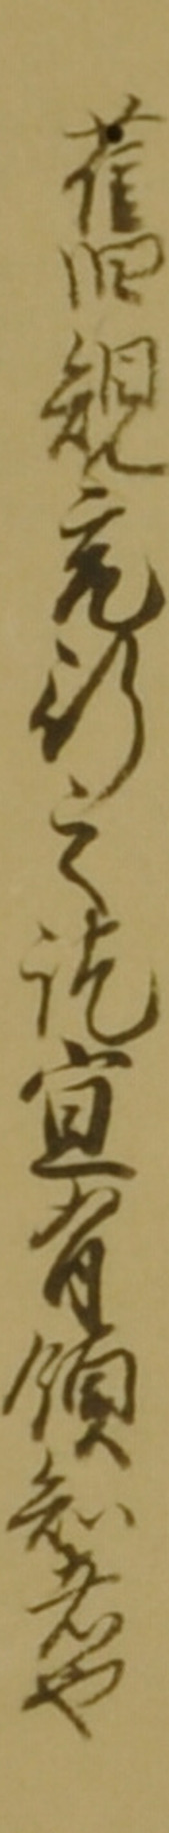旧規充行之訖宜有領知者也
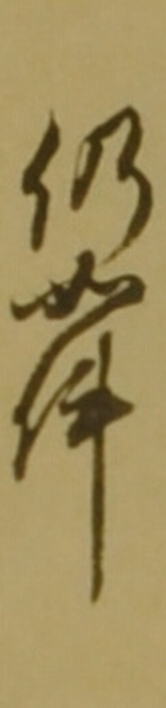仍如件

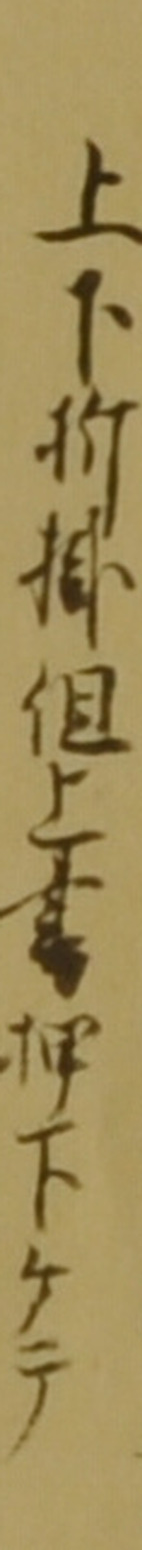上下折掛但上書押下ケテ
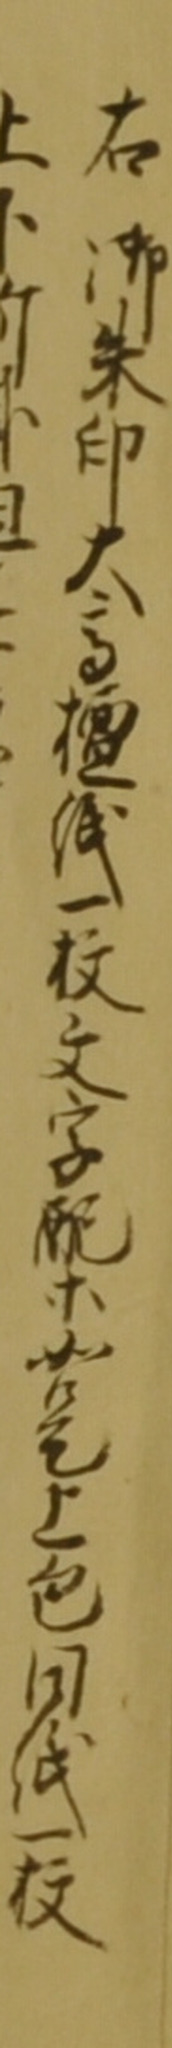右御朱印大高檀紙一枚文字配等如是上包同紙一枚
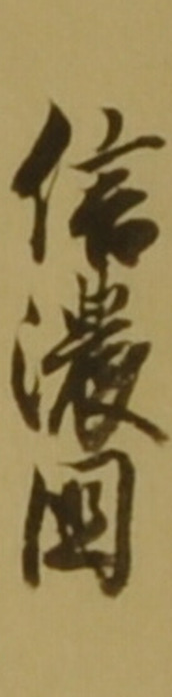信濃国
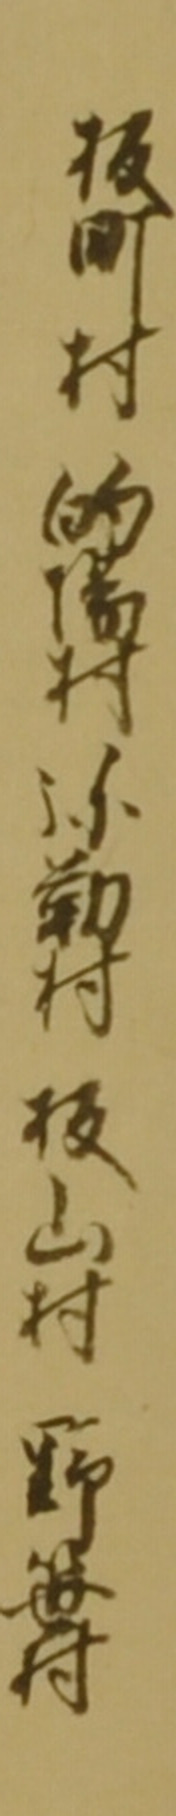板町村的場村弥勒村板山村野笹村
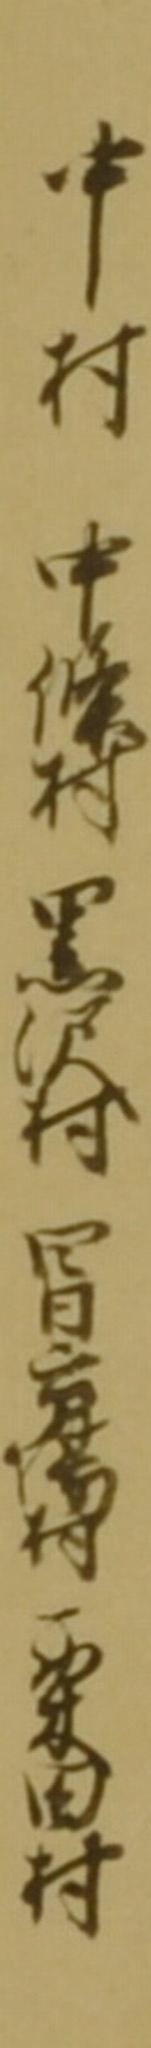中村中条村黒沢村四日市場村栗田村
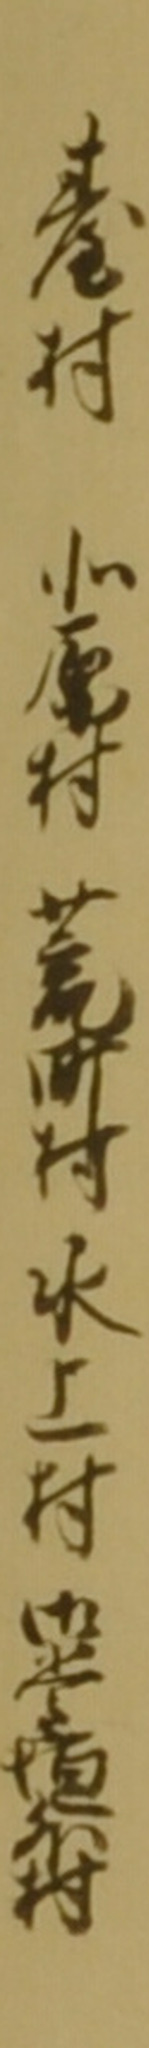台村北原村荒町村水上村御堂垣外村
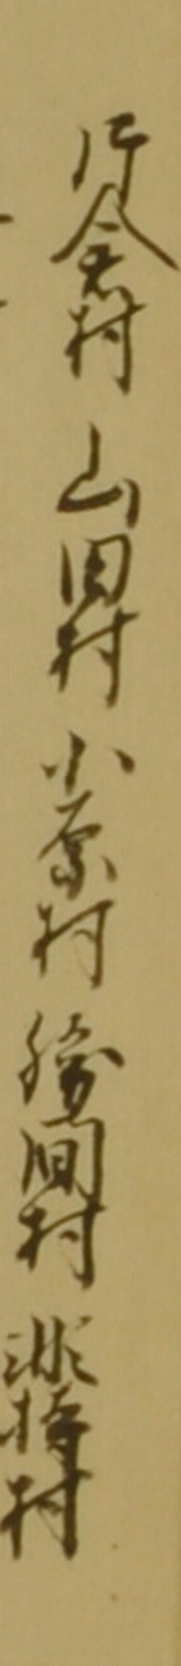片倉村山田村小原村勝間村非持村
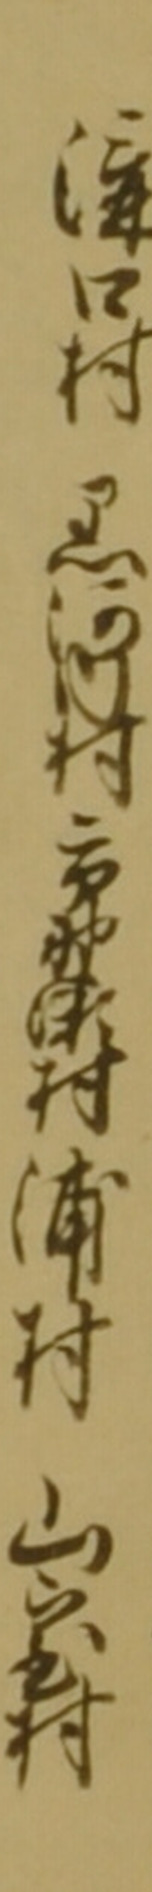溝口村黒河内村市野瀬村浦村山室村
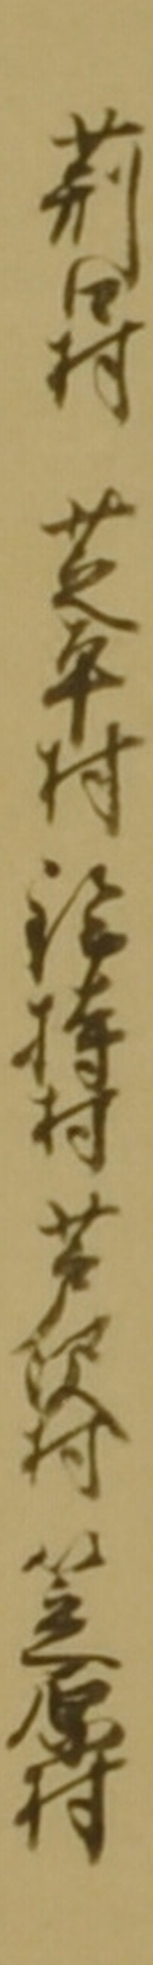荊口村芝平村鉾持村芦沢村笠原村
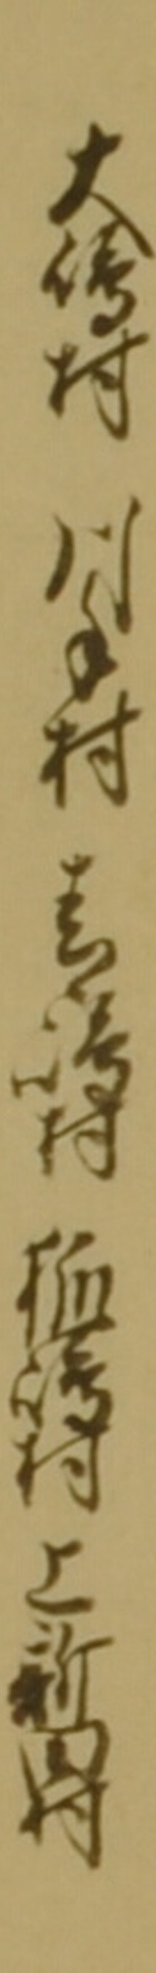大島村川手村青島村狐島村上新田村
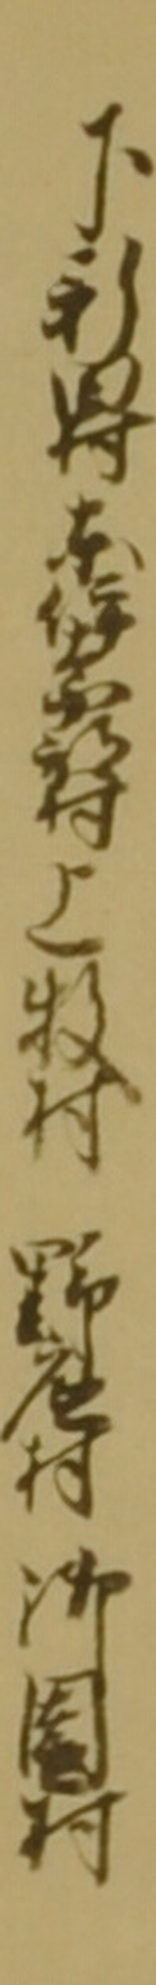下新田村東伊奈部村上牧村野底村御園村
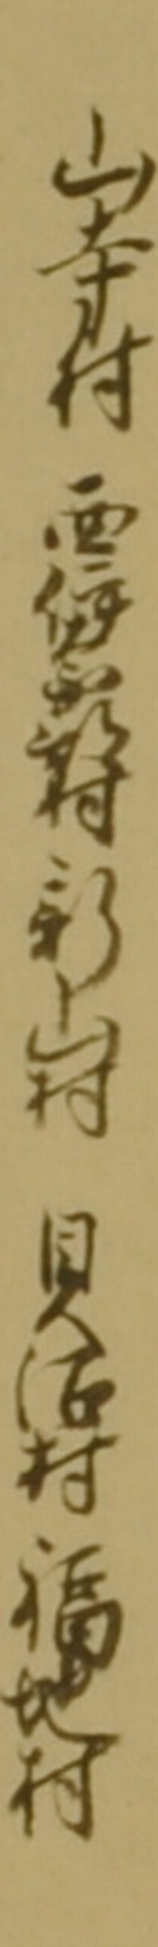山寺村西伊奈部村新山村貝沼村福地村
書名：御朱印・領地目録写
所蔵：伊那市立高遠町図書館・合同会社AMANE
